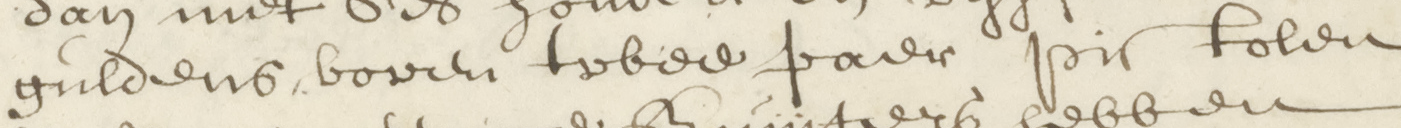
guldens, boven twee paer pistolen
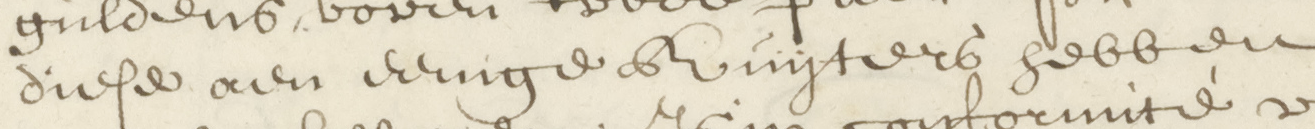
diese aen eenige Ruijters hebben
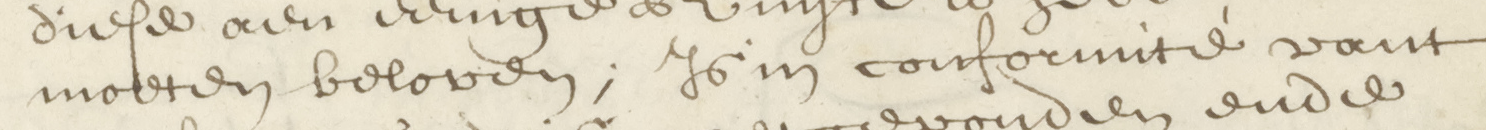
moeten beloven; Is in conformité vant
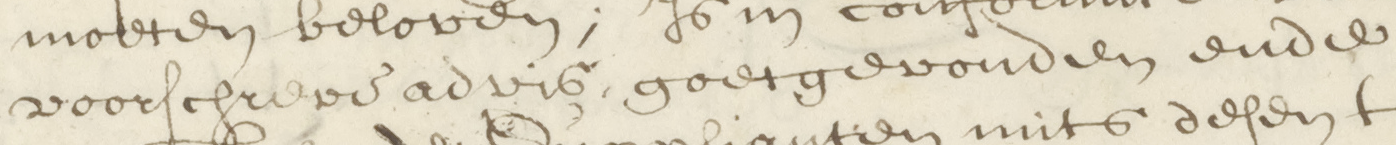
voorschreve advis, goetgevonden ende
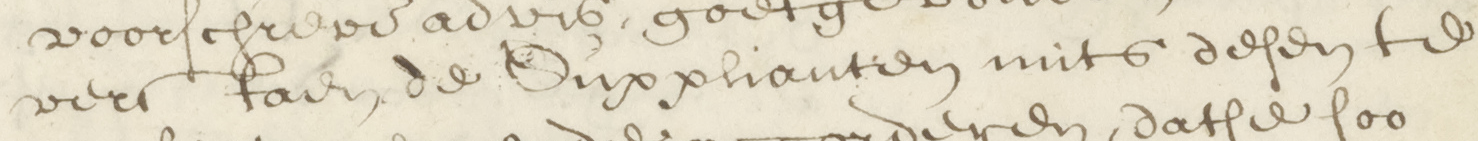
verstaen, de Supplianten mits desen te
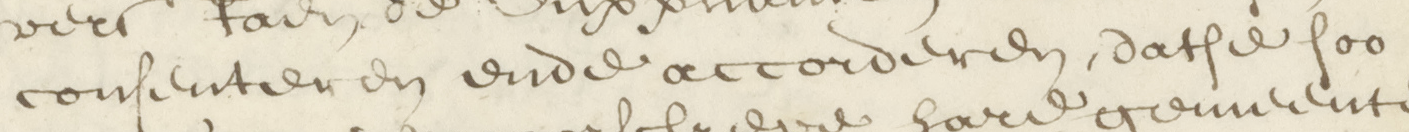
consenteren ende accorderen, datse soo
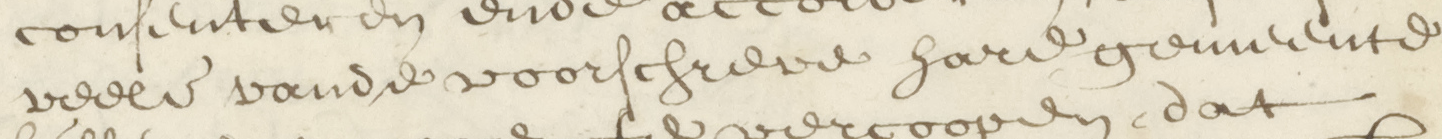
veele vande voorschreve hare gemeente
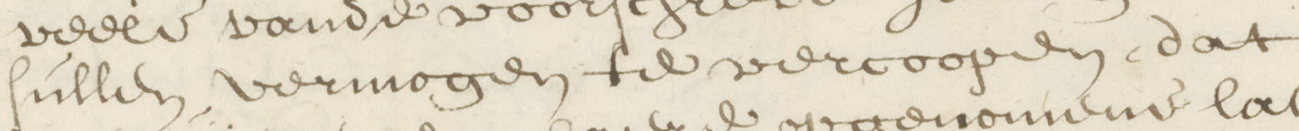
sullen vermogen te vercoopen, dat
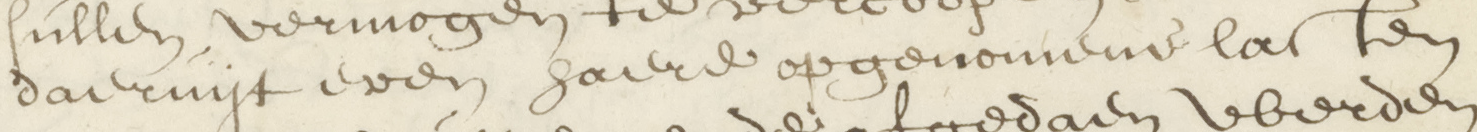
daeruijt even haere opgenomene lasten
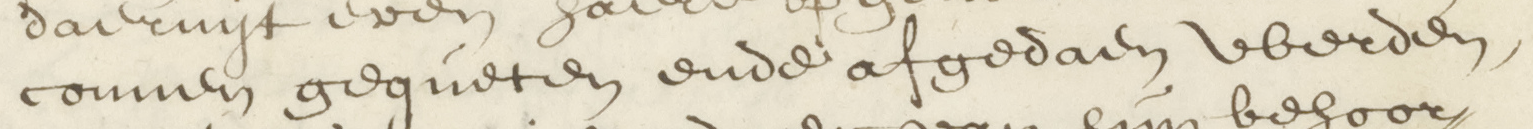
connen gequeten ende afgedaen werden,
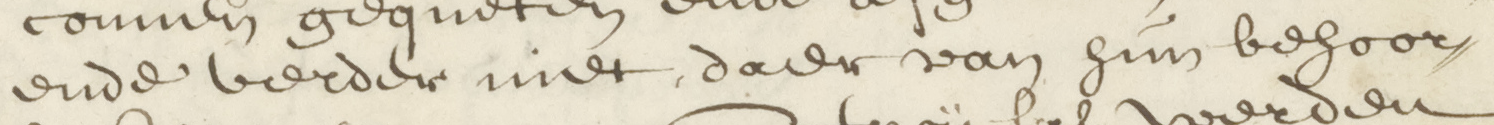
ende verder niet, daer van hun behoor„
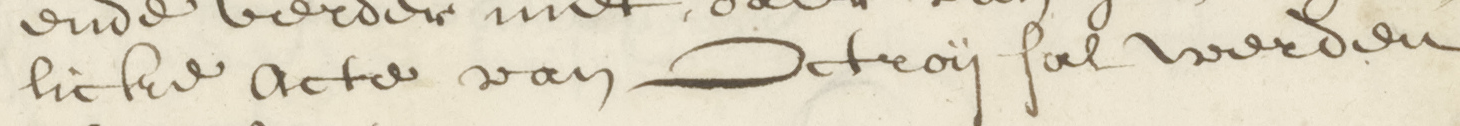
licke Acte van Octroij sal werden
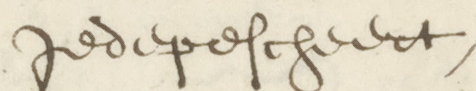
gedepescheert.
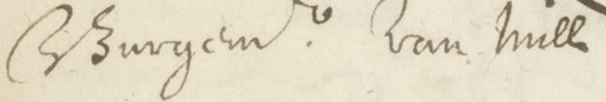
Burgermr. van Mill
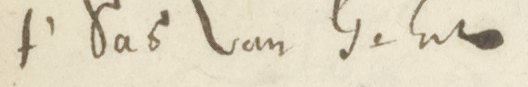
t‛ Sas van Gent
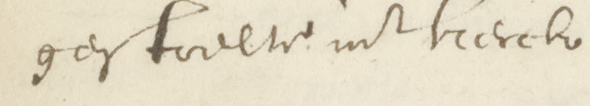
gestoelte int kerck
